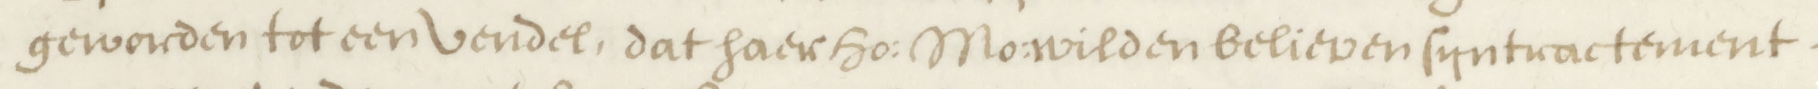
geworden tot een vendel, dat haer Ho:Mo: wilden believen syn tractement —
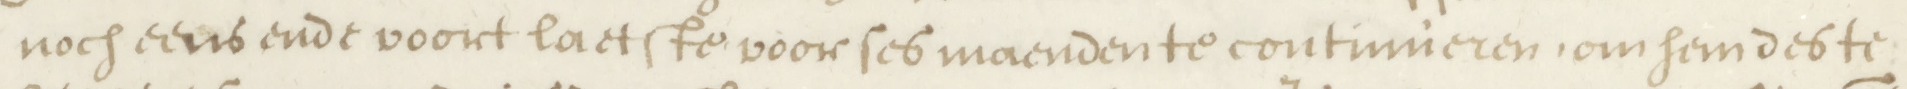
noch eens ende voort laetste voor ses maenden te continueren, om hem des te
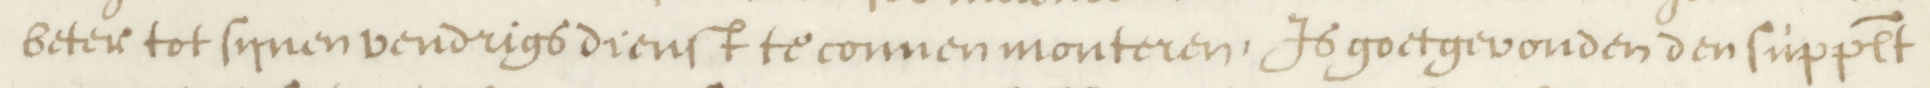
beter tot synen vendrigs dienst te connen monteren. Is goetgevonden den supplt
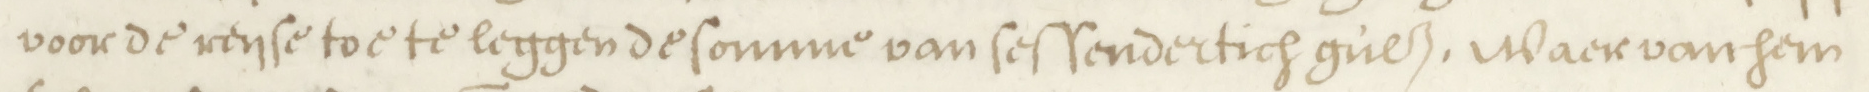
voor de reyse toe te leggen de somme van sessendertich gul. Waer van hem
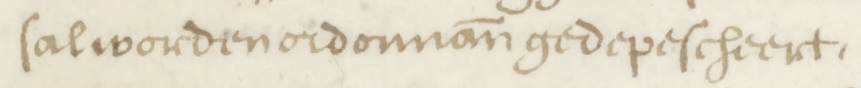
sal worden ordonnan gedepescheert.
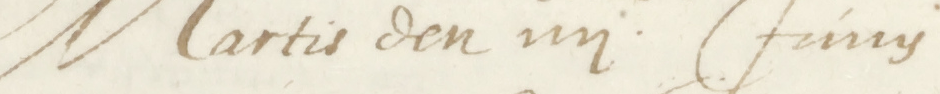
Martis den iiijen. Juny
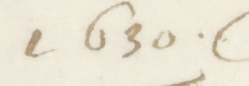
1630.
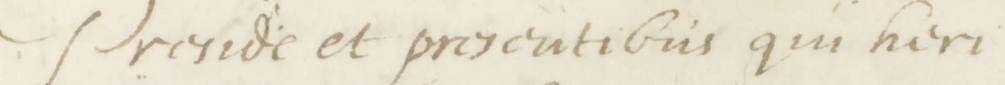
Preside et presentibus qui heri
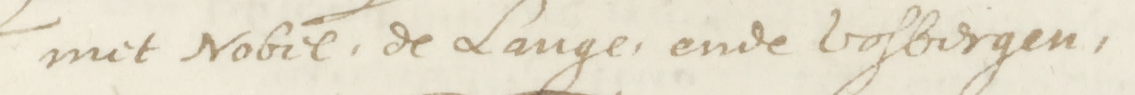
met Nobel, de Lange, ende Vosbergen.
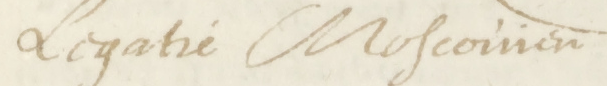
Legatie Moscouien
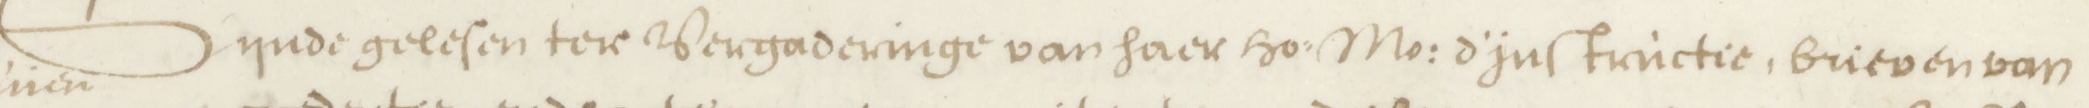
Synde gelesen ter Vergaderinge van haer Ho:Mo: d'instructie, brieven van
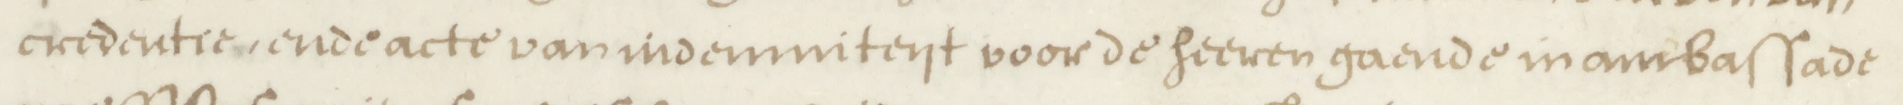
credentie, ende acte van indemniteyt voor de heeren gaende in ambassade
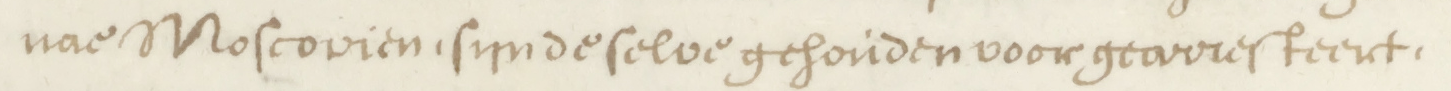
nae Moscovien, syn de selve gehouden voor gearresteert.
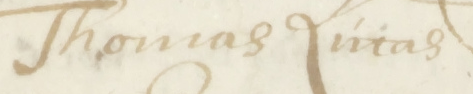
Thomas Lucas
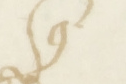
ca
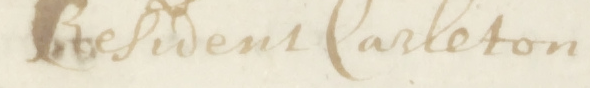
Resident Carleton
